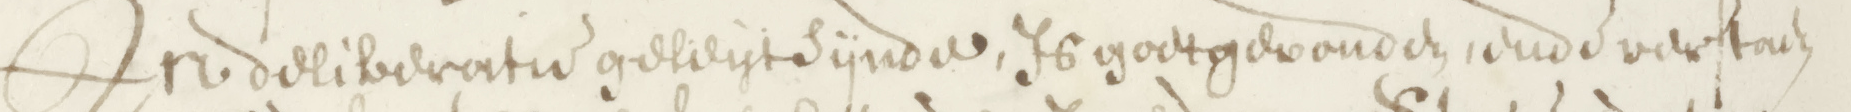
In deliberatie geleijt sijnde, Is goetgevonden, ende verstaen
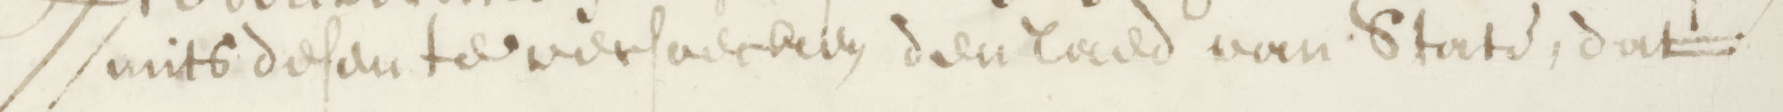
mits desen te versoecken den Raed van State, dat
